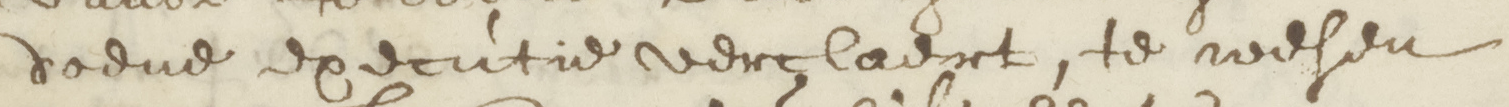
doene executie verclaert, te wesen
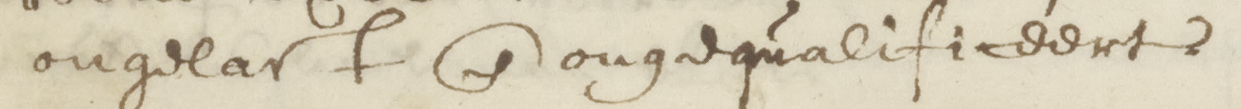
ongelast & ongequalificeert.
